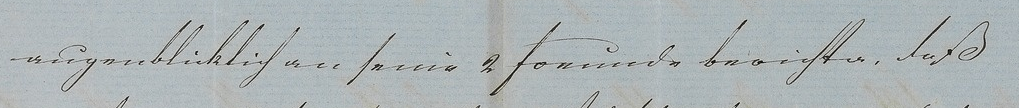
augenblicklich an seine 2 Freunde berichten, daß
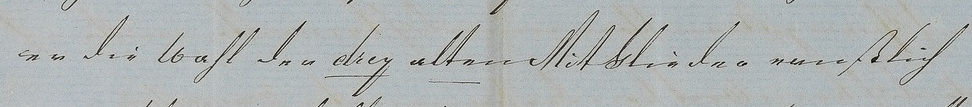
er die Wahl der drey alten MitGlieder ernstlich
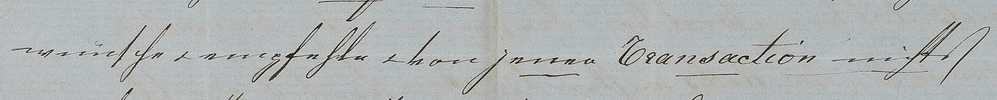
wünsche & empfehle & von jener Transaction nichts
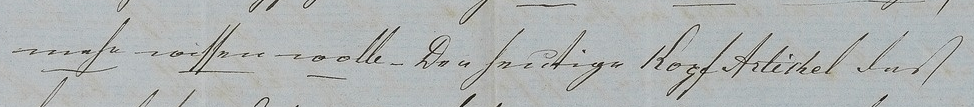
mehr wissen wolle – Der heutige Kopf Artickel des
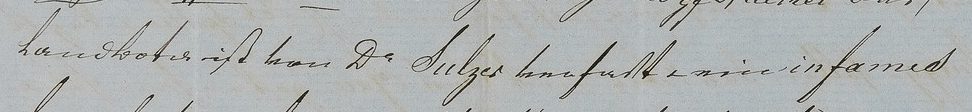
Landboten ist von DrSulzer verfaßt & ein infames
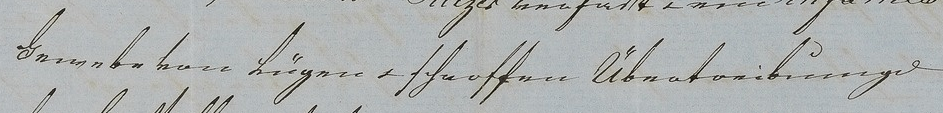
Gewebe von Lügen & schroffen Übertreibungen
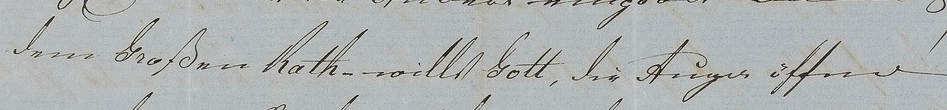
dem Großen Rath – wills Gott, die Augen öffnen
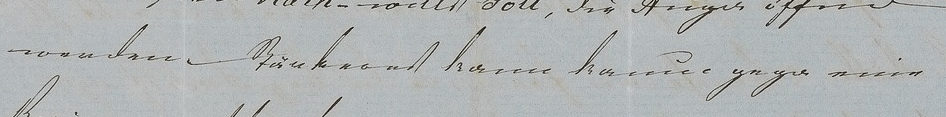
werden – Stärkeres kann kaum gegen eine
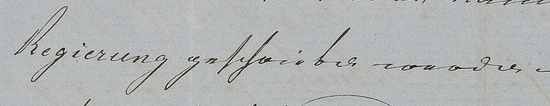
Regierung geschrieben werden. –
